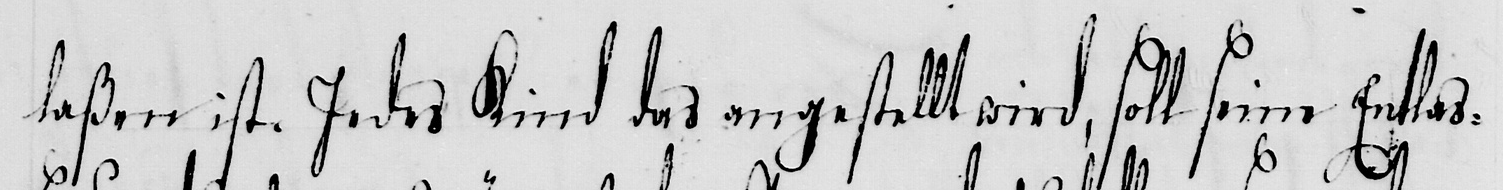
laßen ist. Jedes Kind das angestellt wird, soll seine
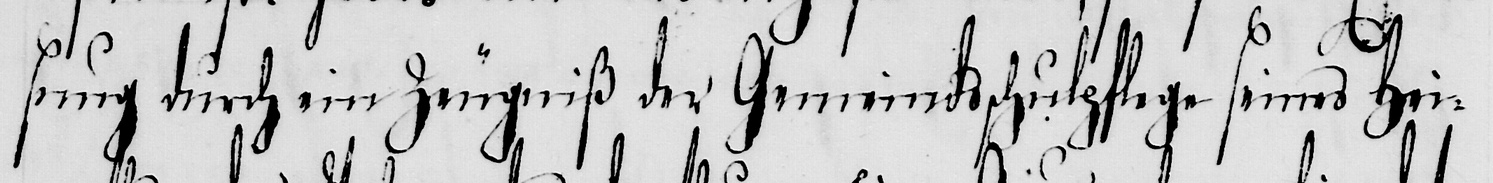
ßung durch ein Zeugniß der Gemeindsschulpflege seines Hei¬
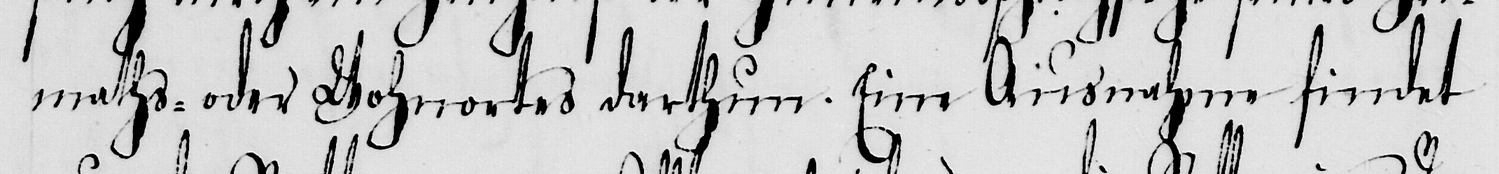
maths- oder Wohnortes darthun. Eine Ausnahme findet
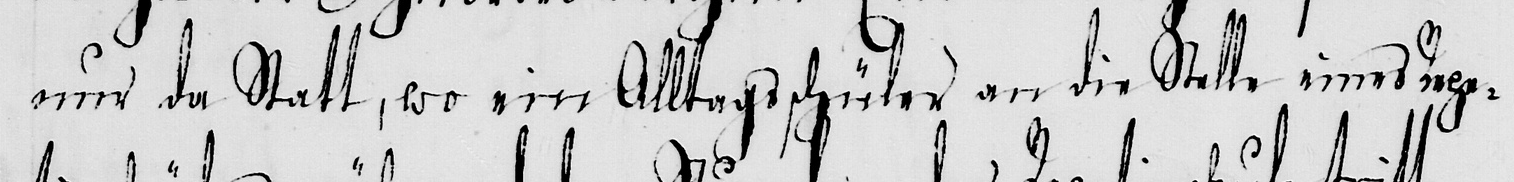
nur da Statt, wo ein Alltagsschüler an die Stelle eines Repe¬
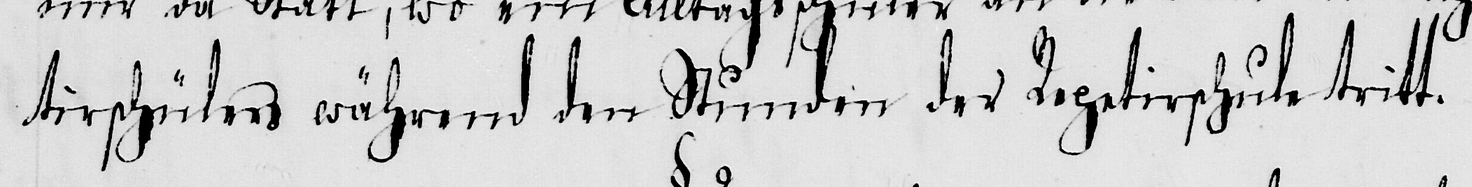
tirschülers während den Stunden der Repetirschule tritt.
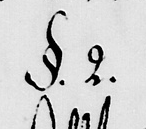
§. 2.
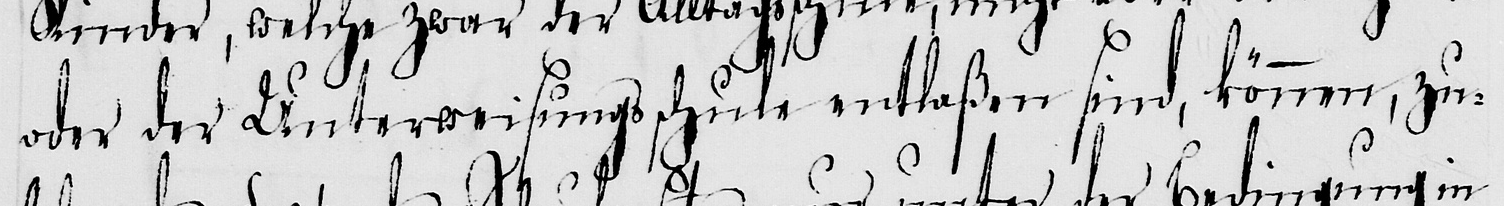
oder der Unterweisungsschule entlaßen sind, können, zu¬
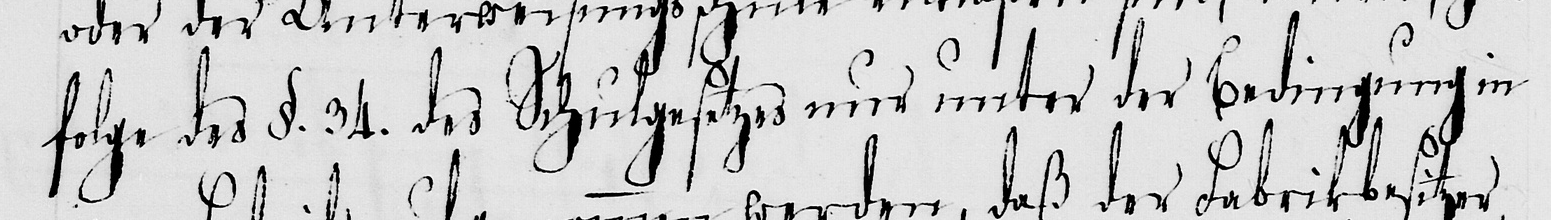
folge des §. 34. des Schulgesetzes nur unter der Bedingung in
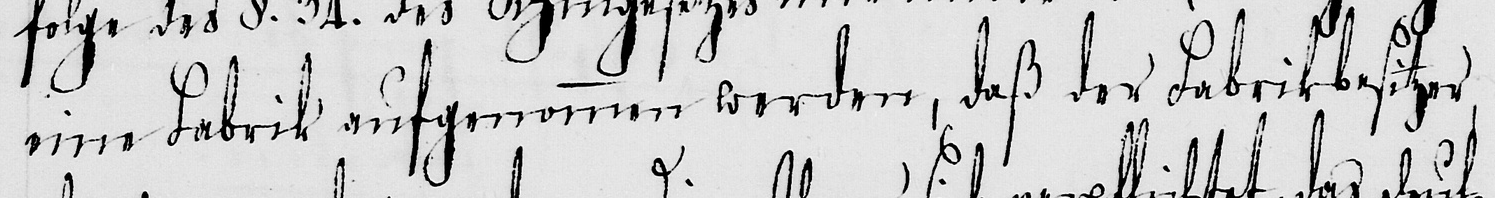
eine Fabrik aufgenommen werden, daß der Fabrikbesitzer
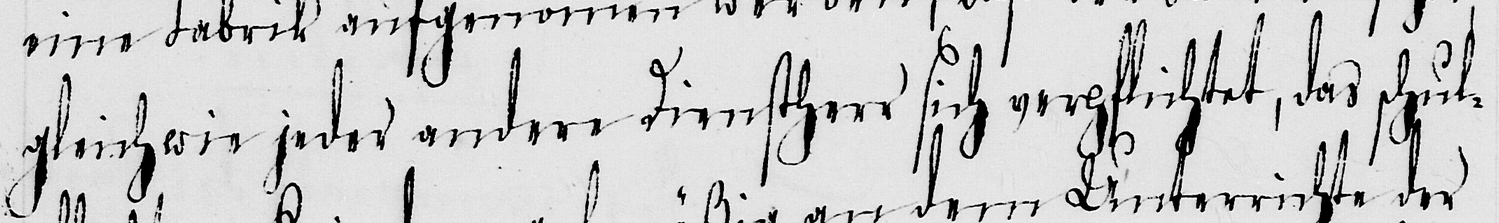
gleichwie jeder andere Dienstherr sich verpfli¬
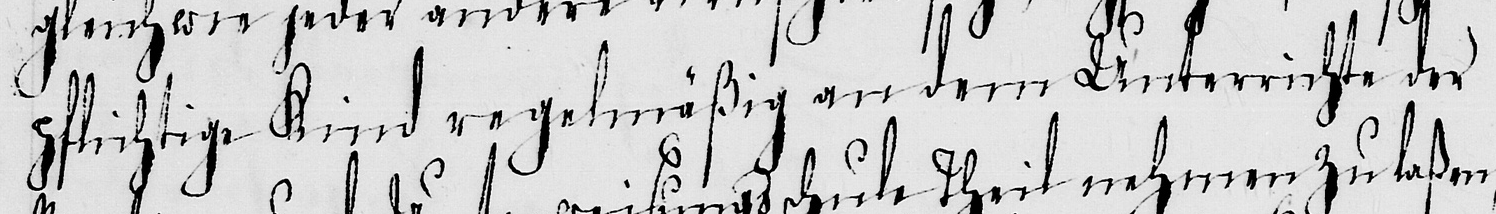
pflichtige Kind regelmäßig an dem Unterrichte der
